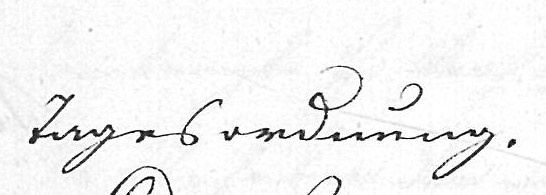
Tagesordnung.
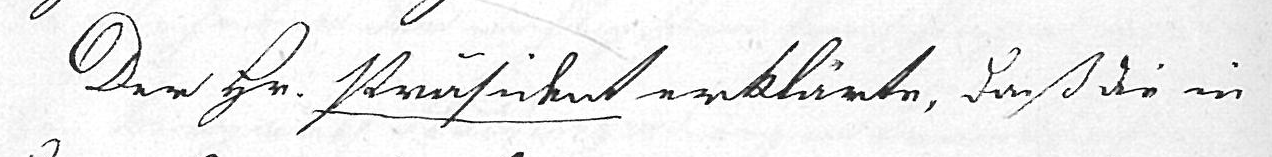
Der Hr. Präsident erklärte, daß die in
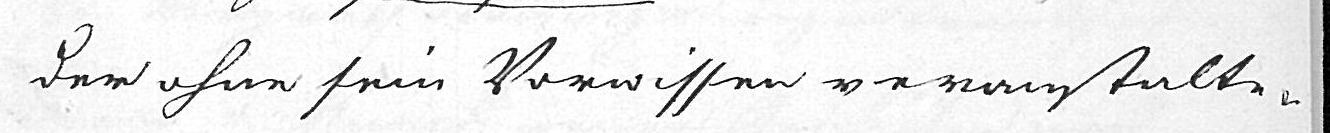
der ohne sein Vorwissen veranstalte-
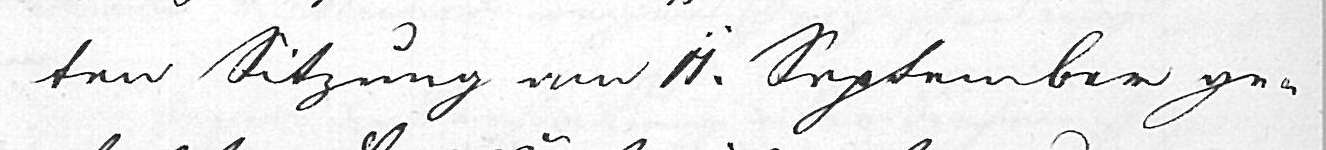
ten Sitzung am 11. September ge-
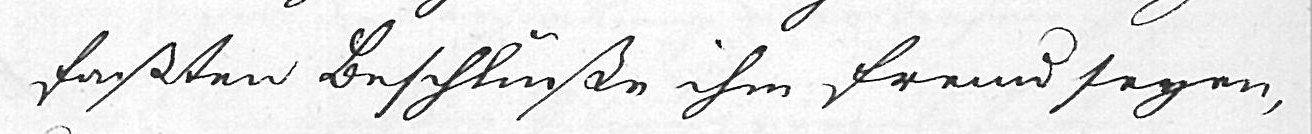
faßten Beschlüße ihm fremd seyen,
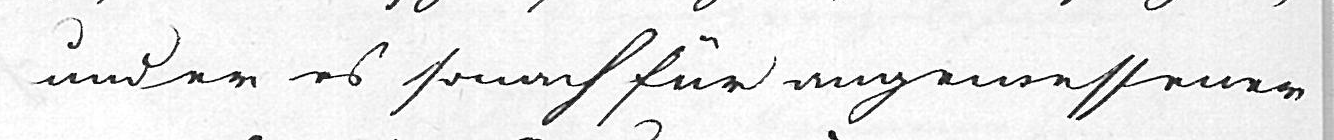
und er es sonach für angemessener
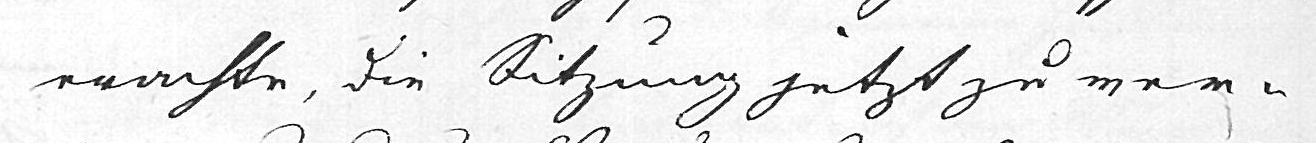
erachte, die Sitzung jetzt zu ver-
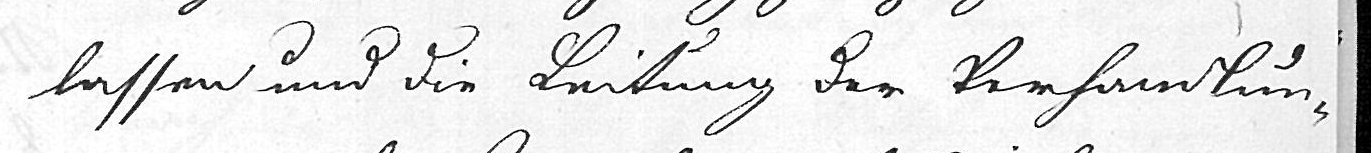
lassen und die Leitung der Verhandlun-
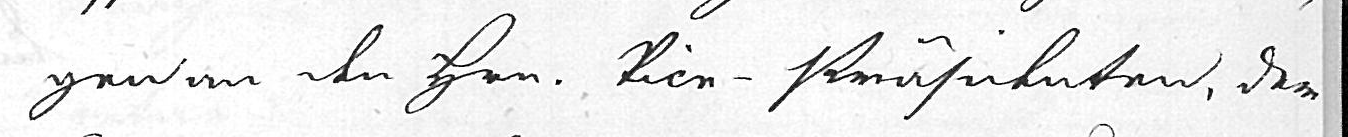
gen an den Hrn. Vice-Präsidenten, der
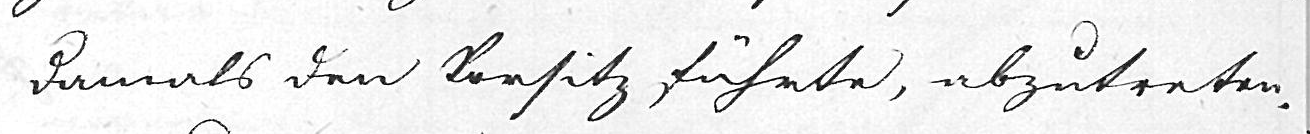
damals den Vorsitz führte, abzutreten.
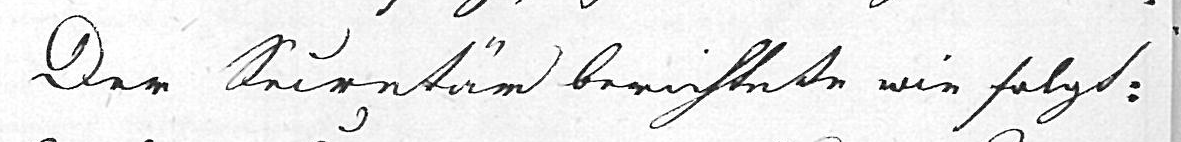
Der Secretär berichtet wie folgt:
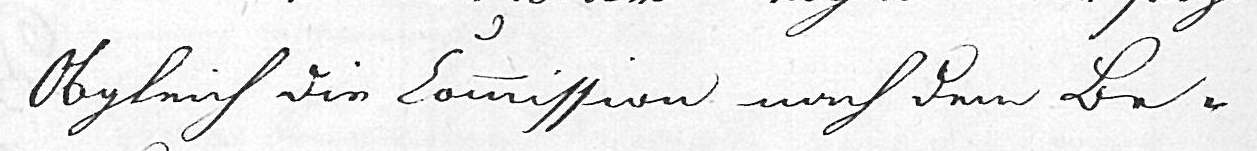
Obgleich die Commission nach dem Be-
